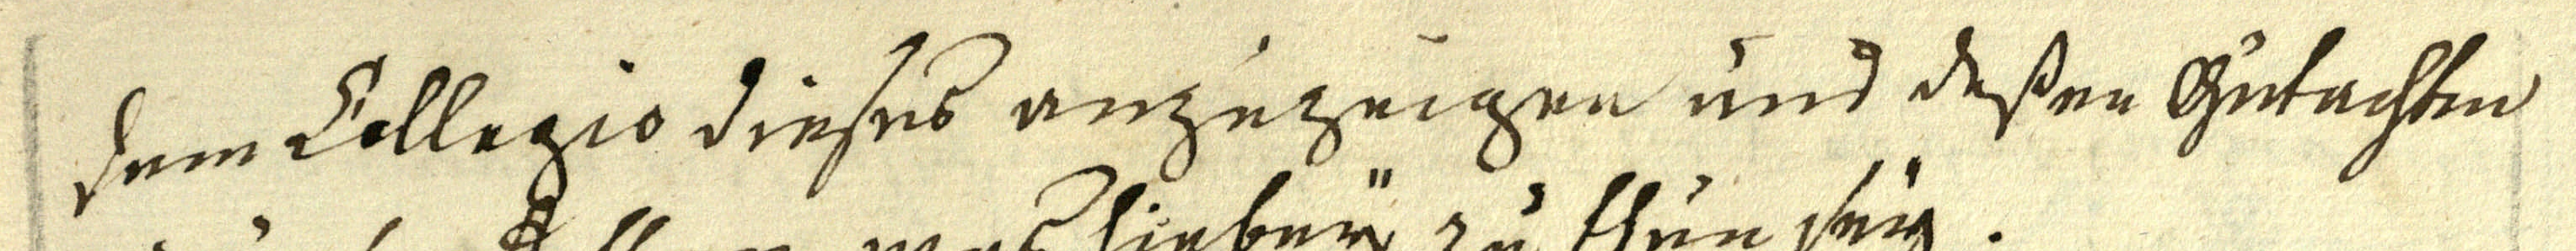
dem Collegio dieses anzuzeigen und deßen Gutachten
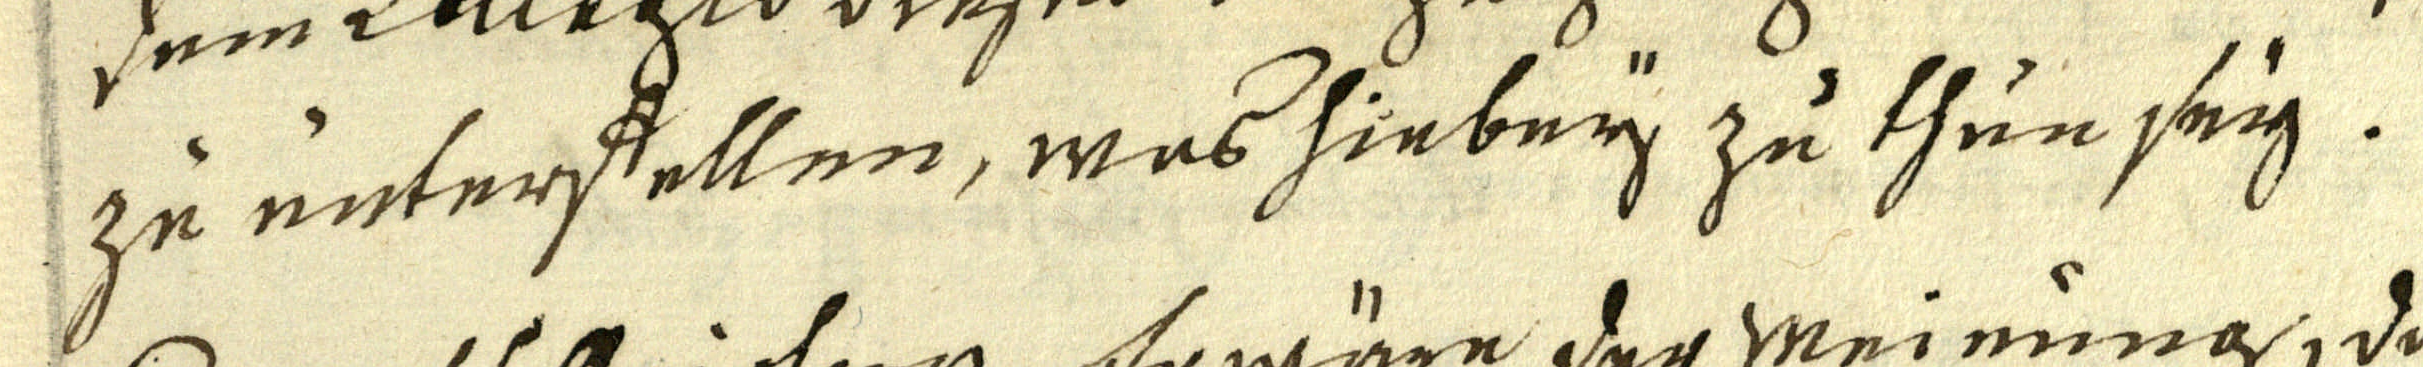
zu unterstellen, was hiebeÿ zu thun seÿ.
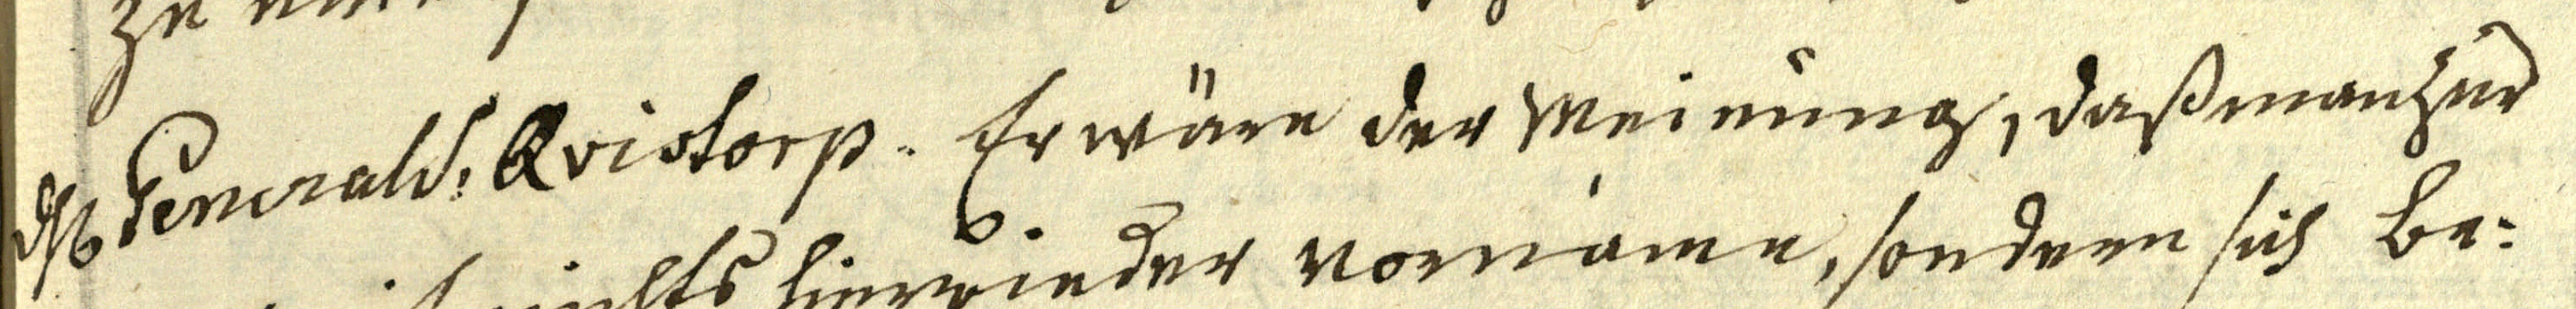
dh. GeneralS. Quistorp. Er wäre der Meinung, daß man zur
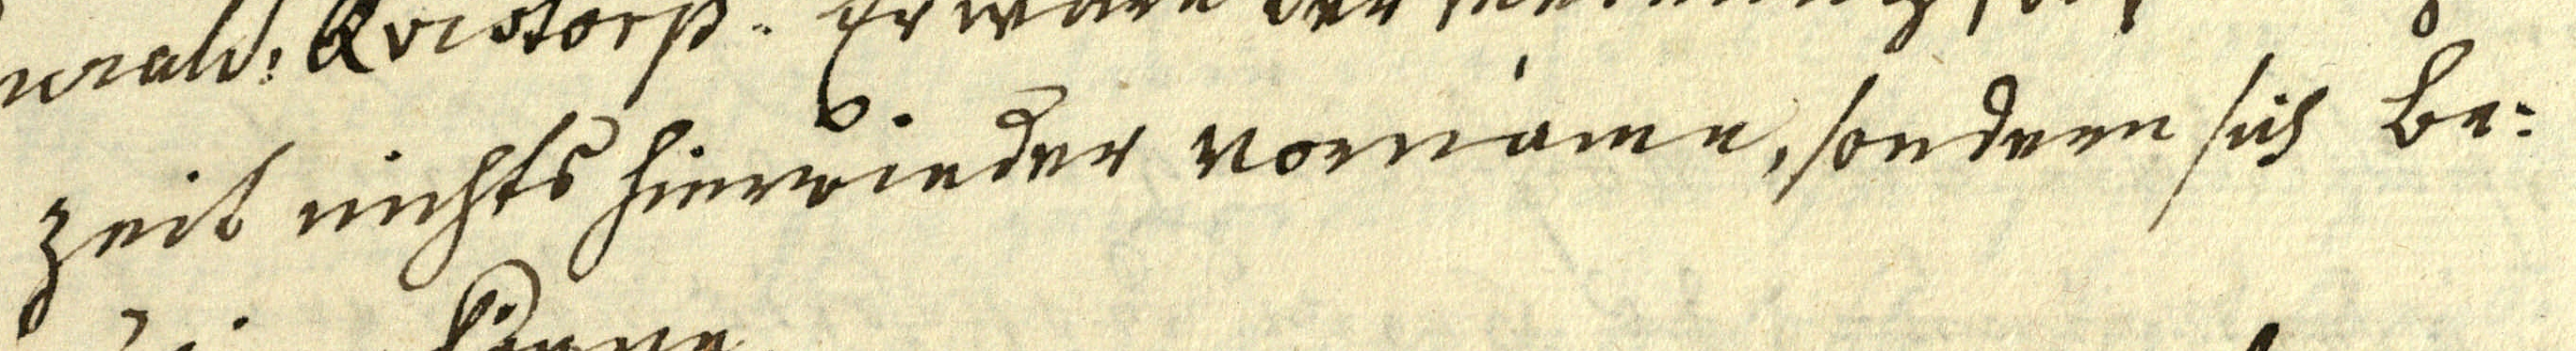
Zeit nichts hierwieder vornäme, sondern sich be¬
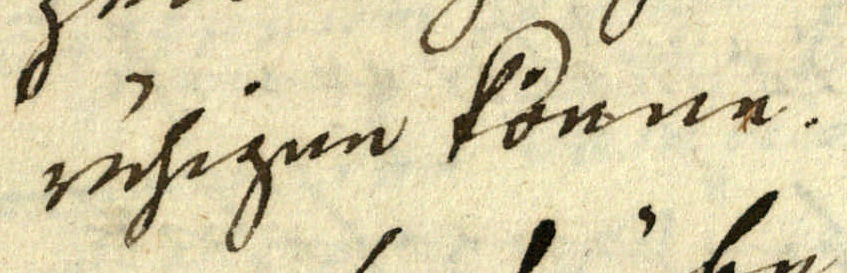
ruhigen könne.
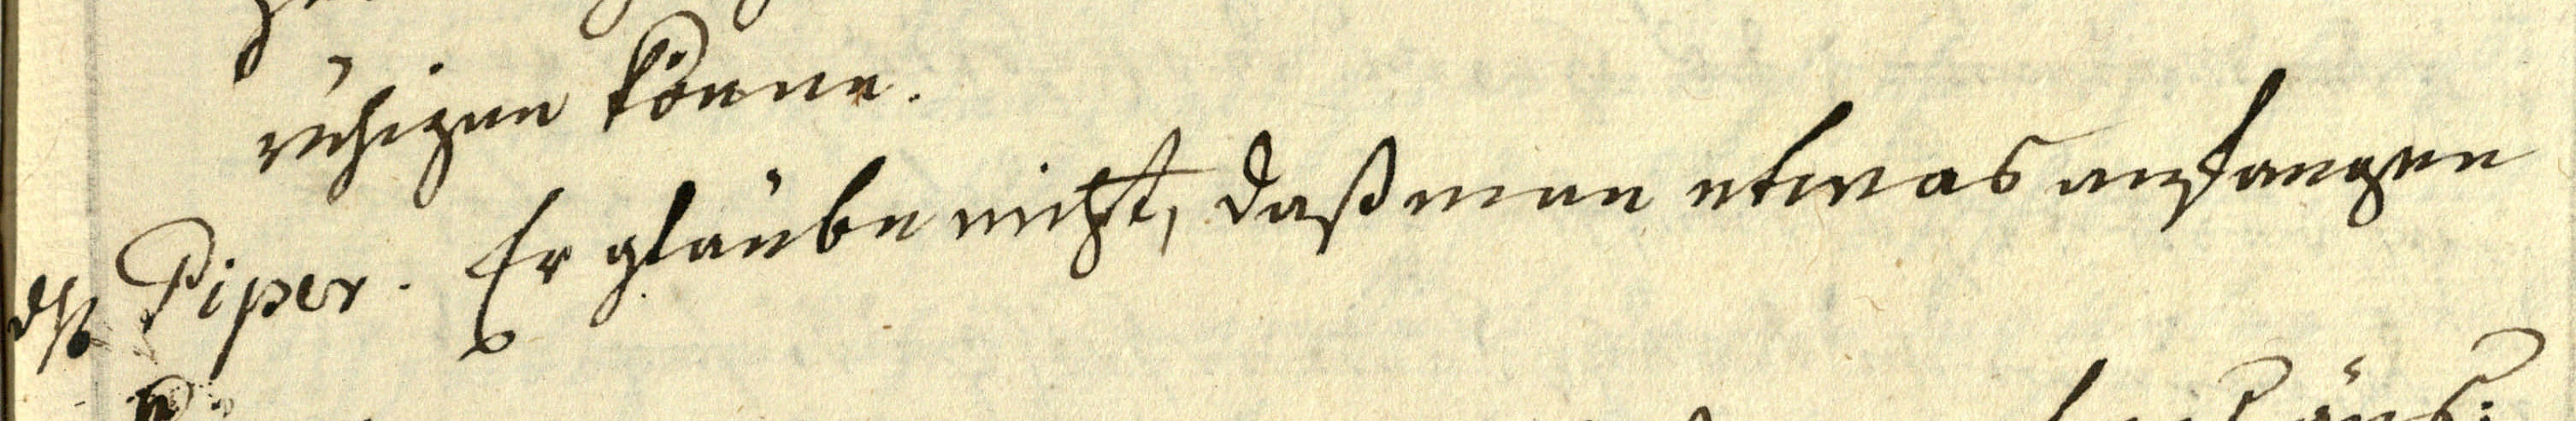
dh. Piper. Er glaube nicht, daß man etwas anfangen
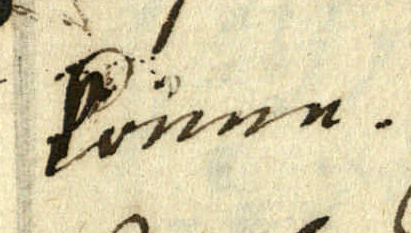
könne.
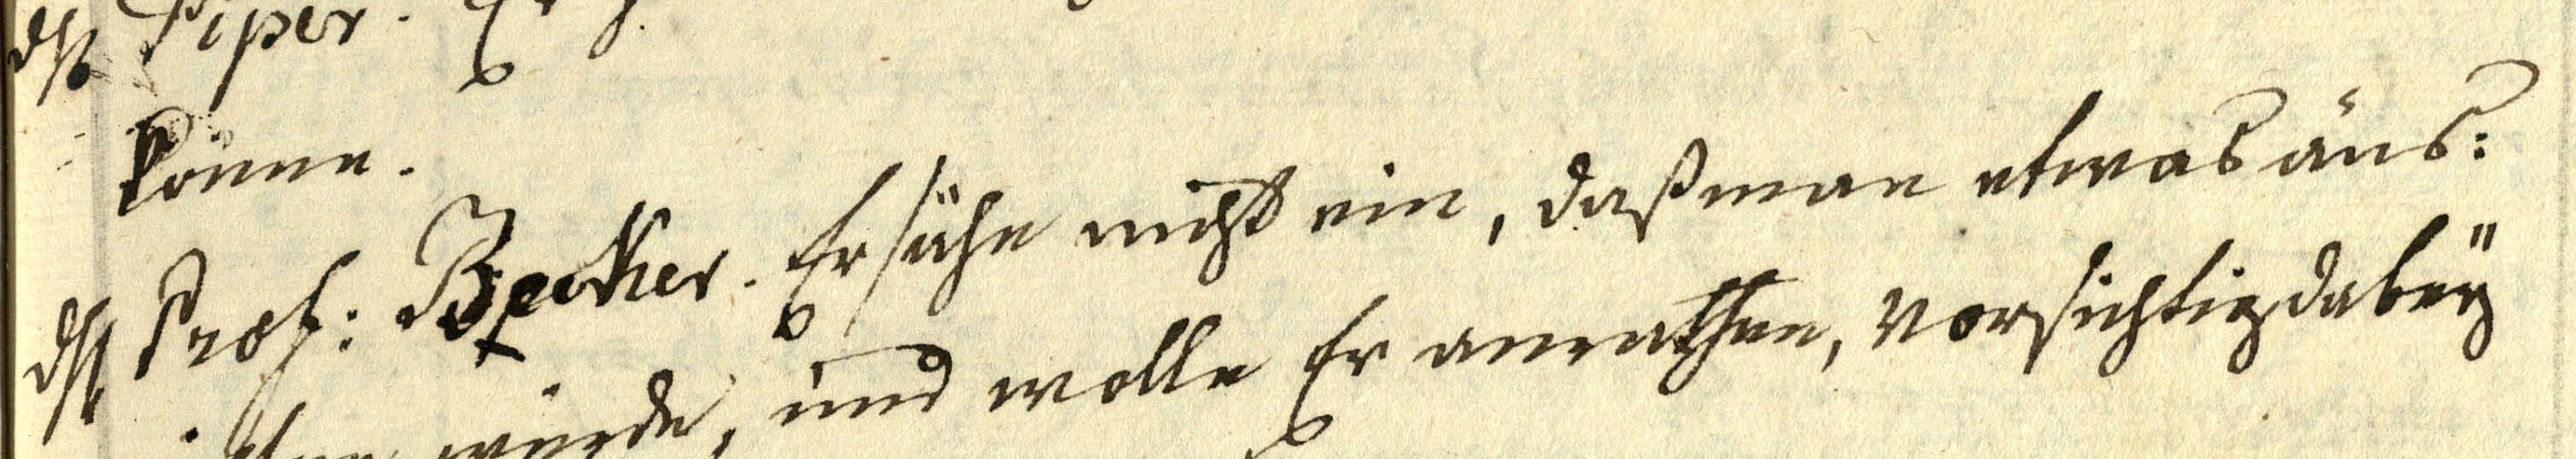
dh Prof. Becker. Er sähe nicht ein, daß man etwas aus¬
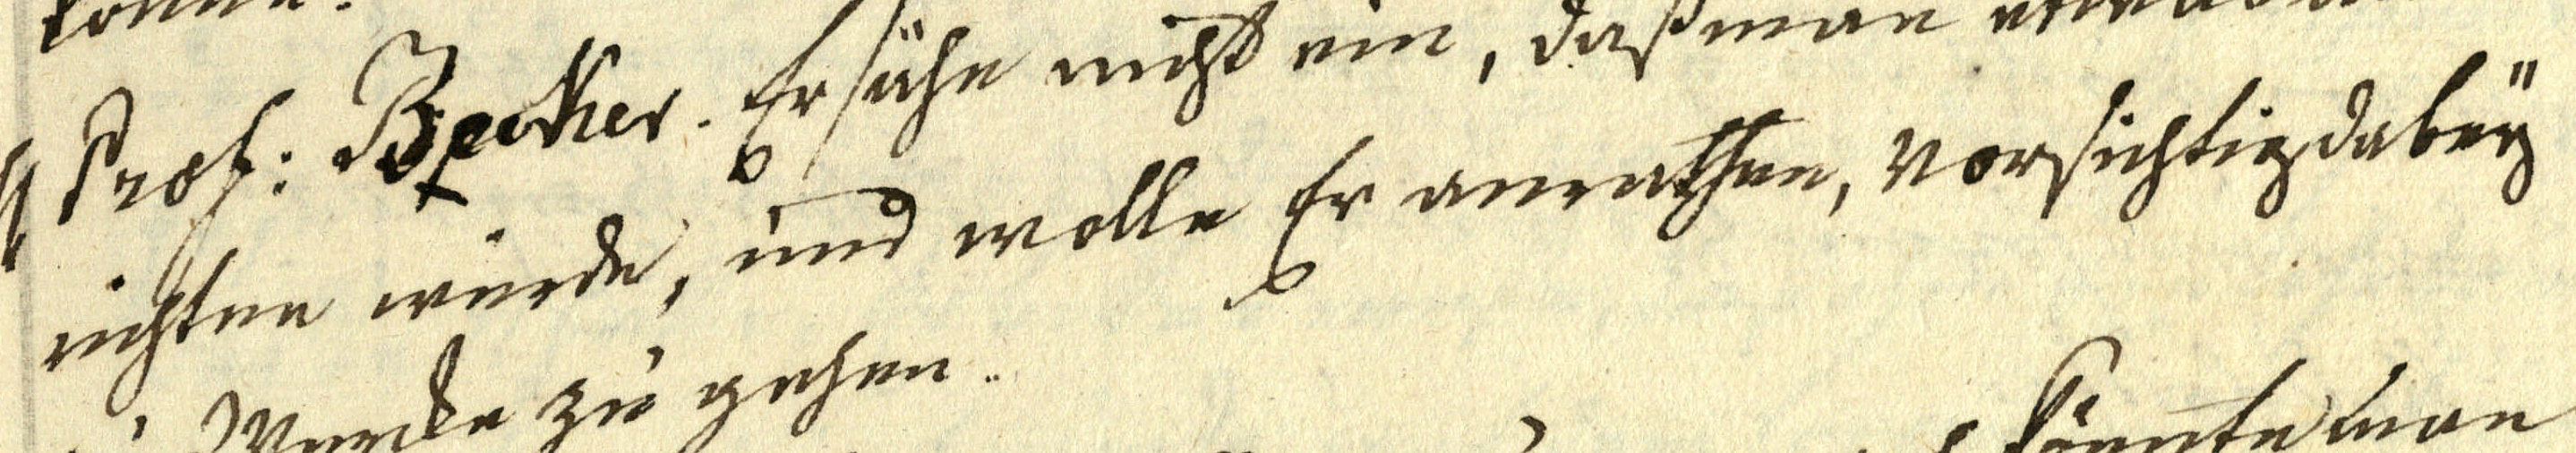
richten würde, und wolle Er anrathen, vorsichtig dabeÿ
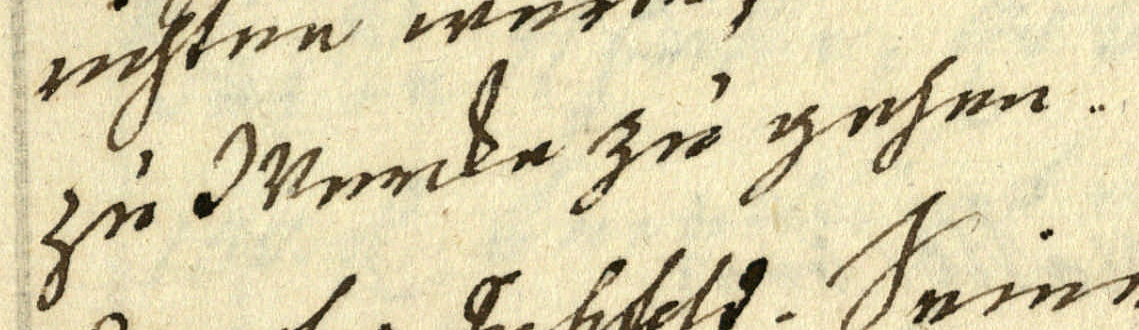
zu Wercke zu gehen.
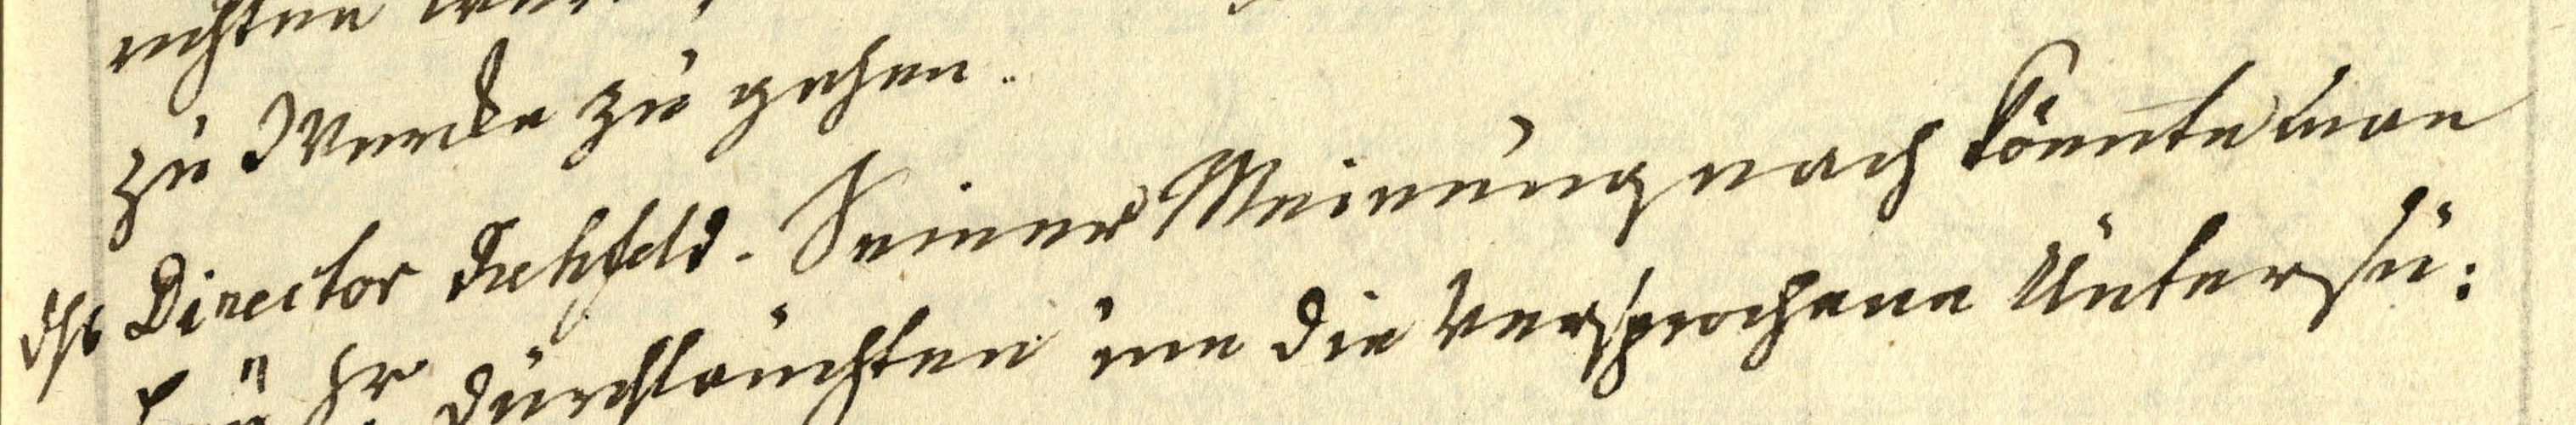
dh. Director Rehfeld. Seiner Meinung nach könnte man
